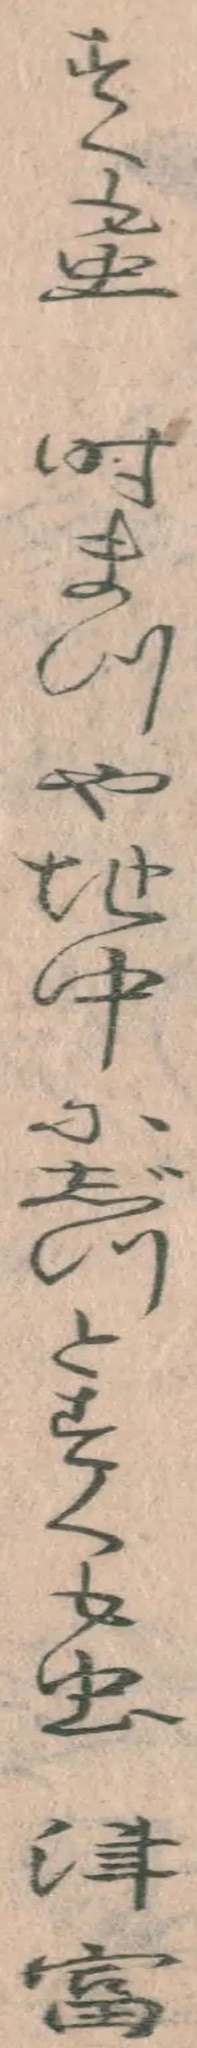すくも虫時まつや地中にじつとすくも虫津富
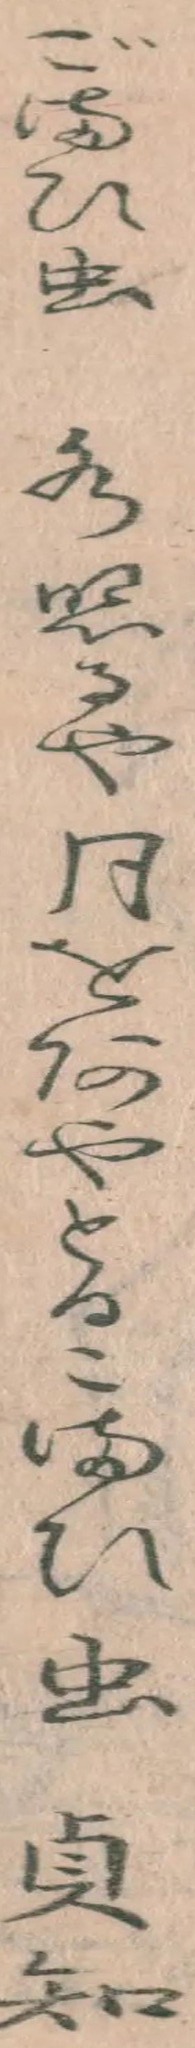ごまひ虫水照るや月をあやとるこまひ虫貞知
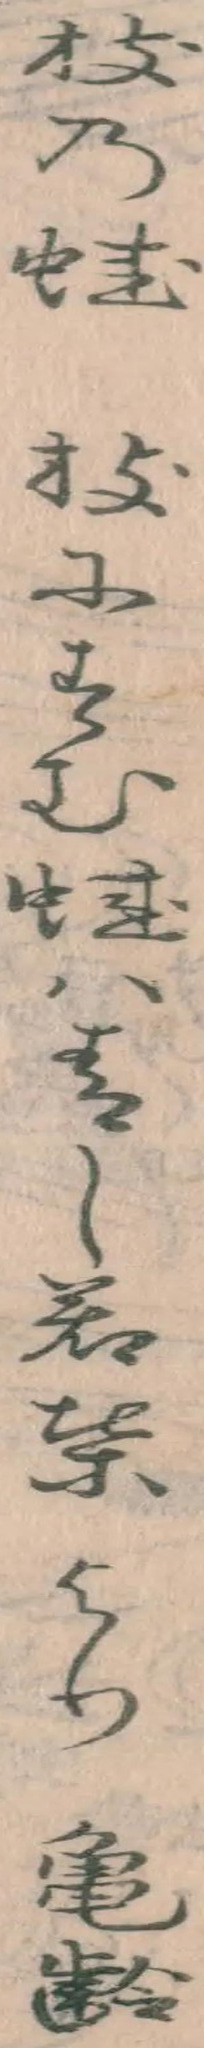枝の蛙枝にすむ蛙は青し若葉より亀齢
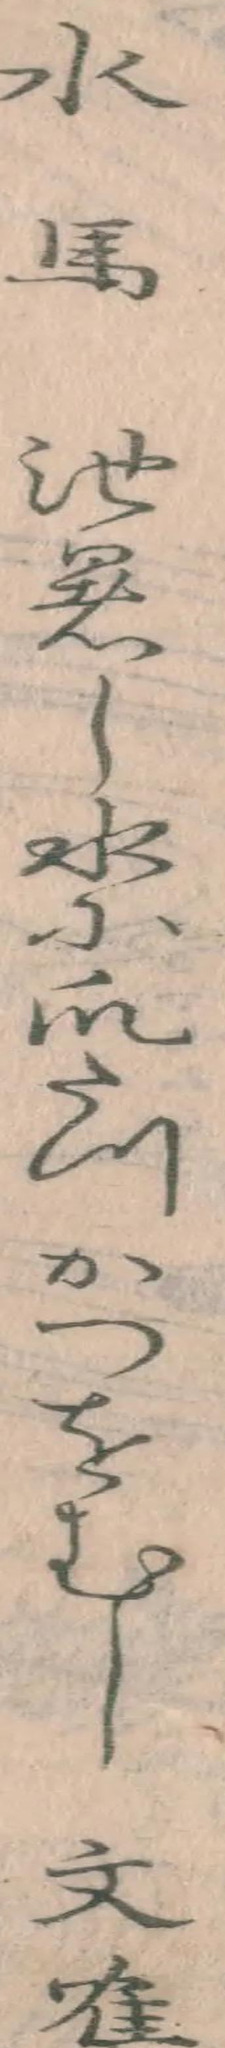水馬池暑し水に爪たつかつをむし文隺
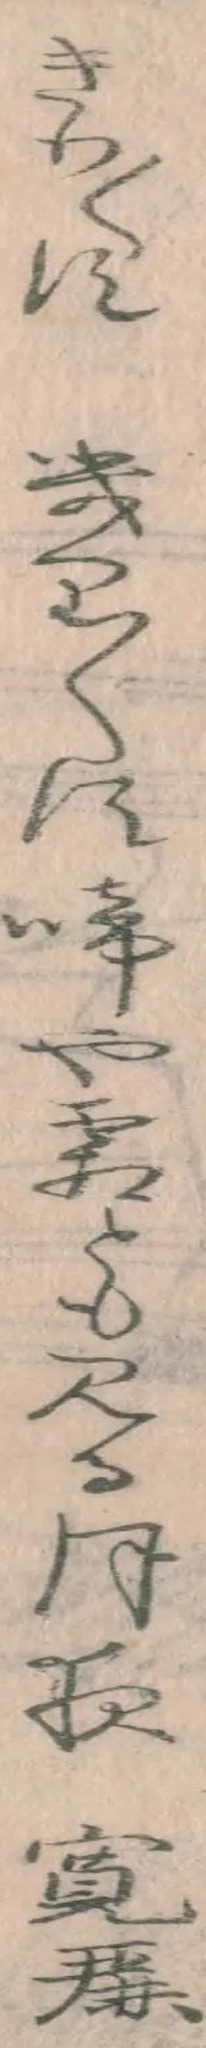きり〳〵すきり〳〵す啼や霜とも見る月夜寛麗
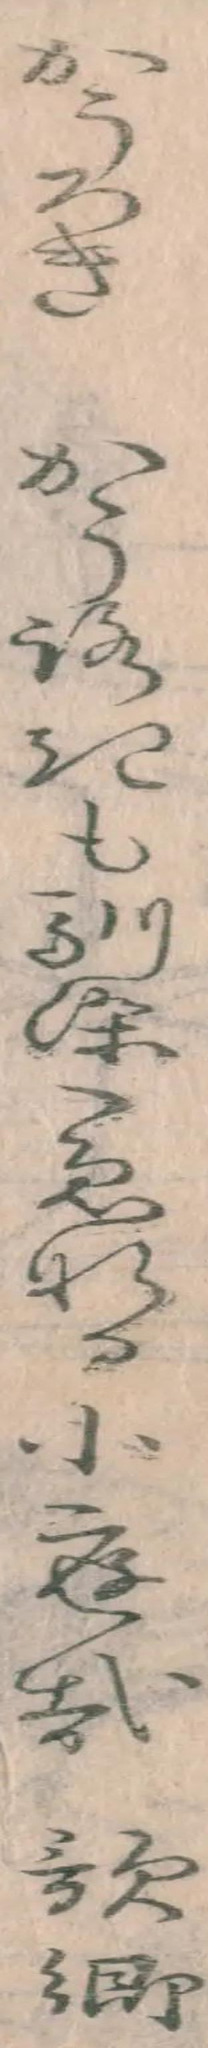かうろきかうろきも馴染こゑなる小庭哉歌郷
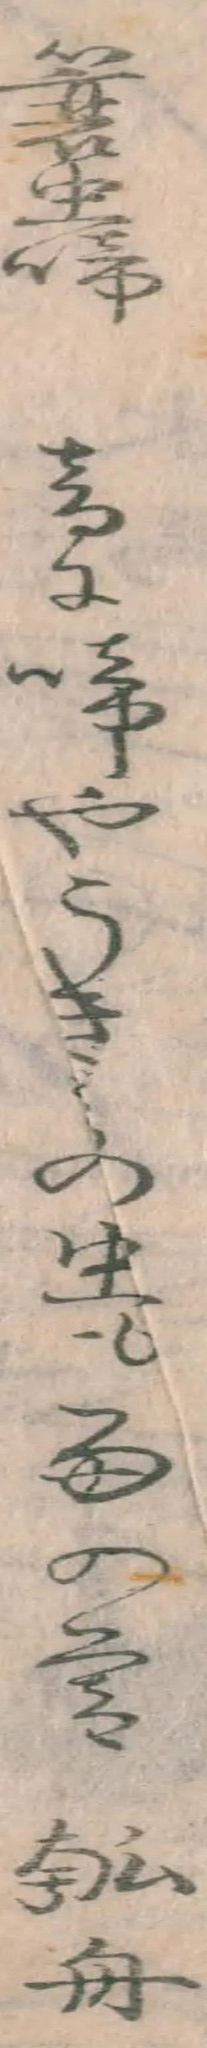蓑虫啼音に啼やうきみの虫も雨の暮瓠舟
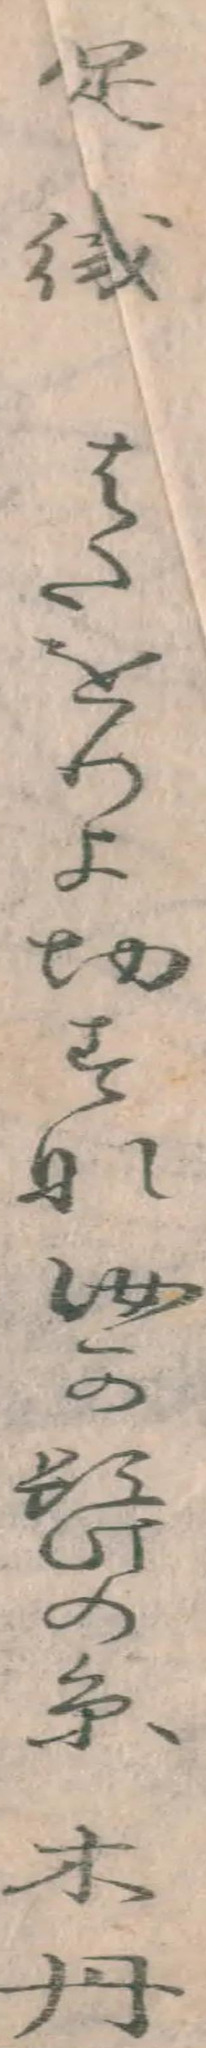促織はたをりよ切すな汝か髭の糸木丹
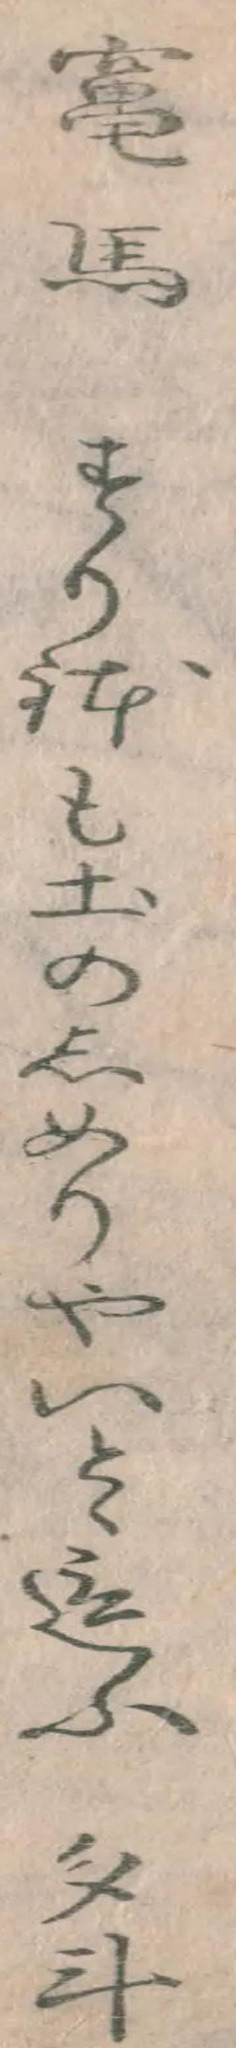竈馬すり鉢も土のしめりやいとゝ這ふ夕斗
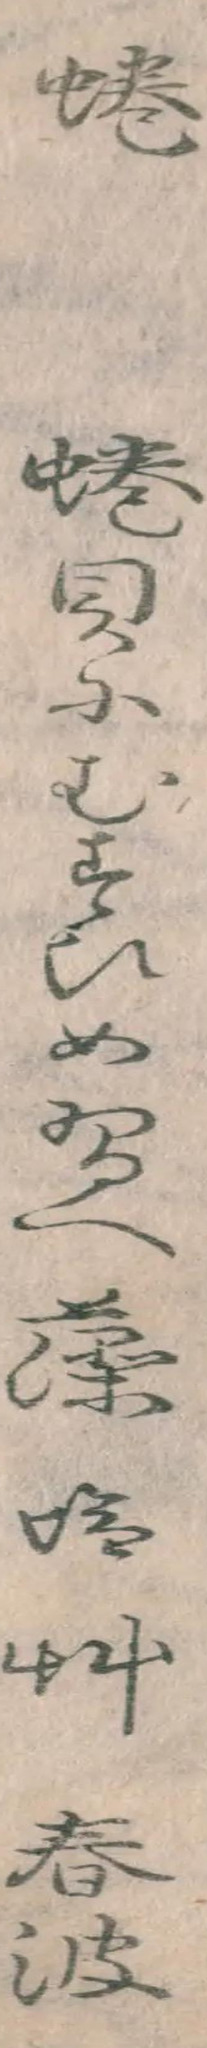蜷蜷貝にむすひめ習へ藻塩草春波
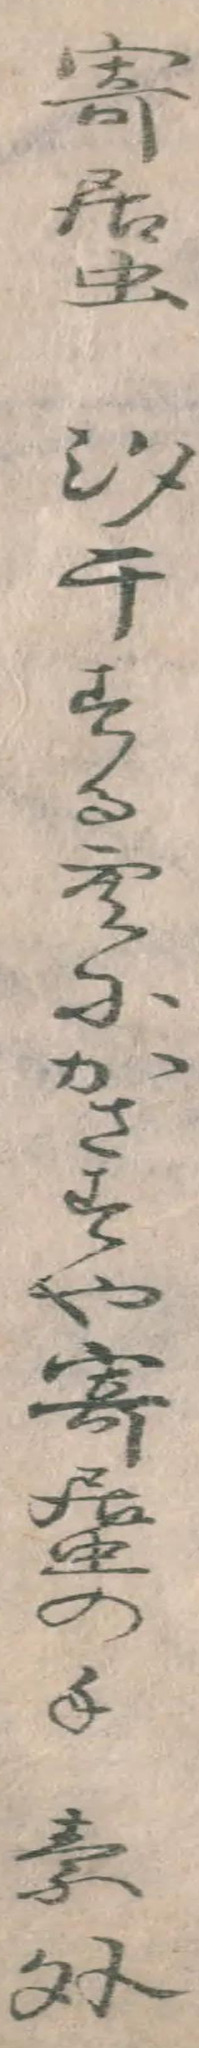寄居虫汐干する雲にかさすや寄居虫の手素外
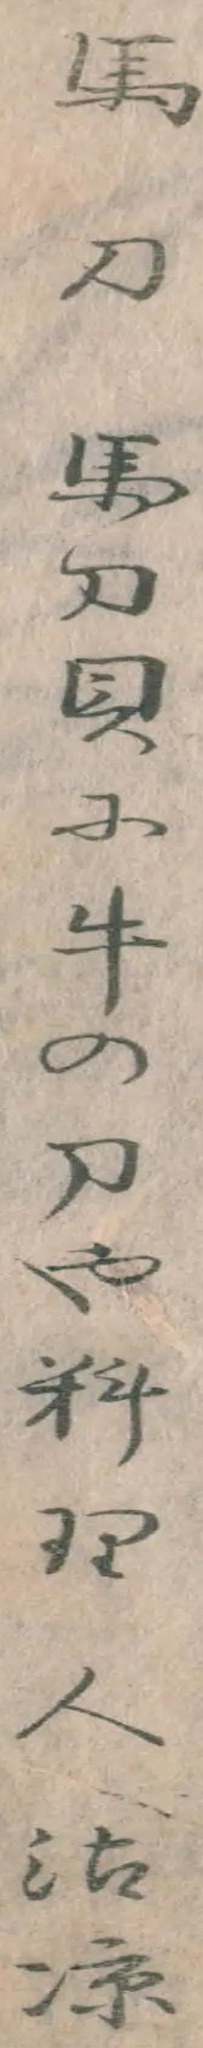馬力馬力貝に牛の刀や料理人沾凉

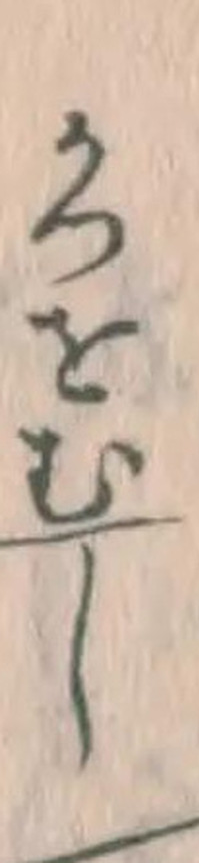かつをむし
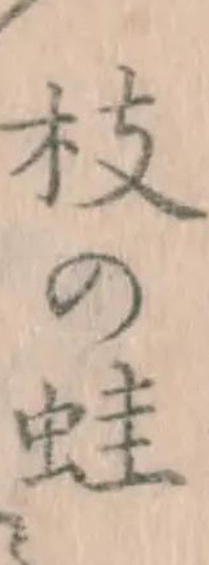枝の蛙

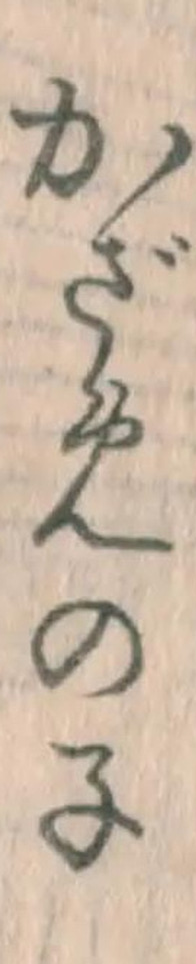かざめの子
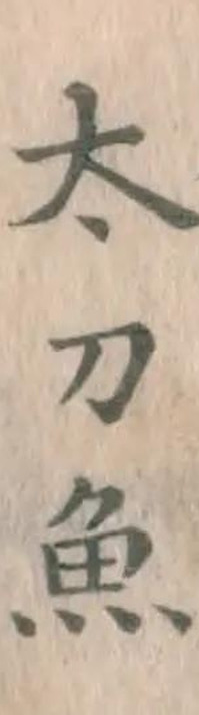太刀魚
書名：誹諧名知折 2巻. [2]
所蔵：国立国会図書館 National Diet Library, JAPAN
